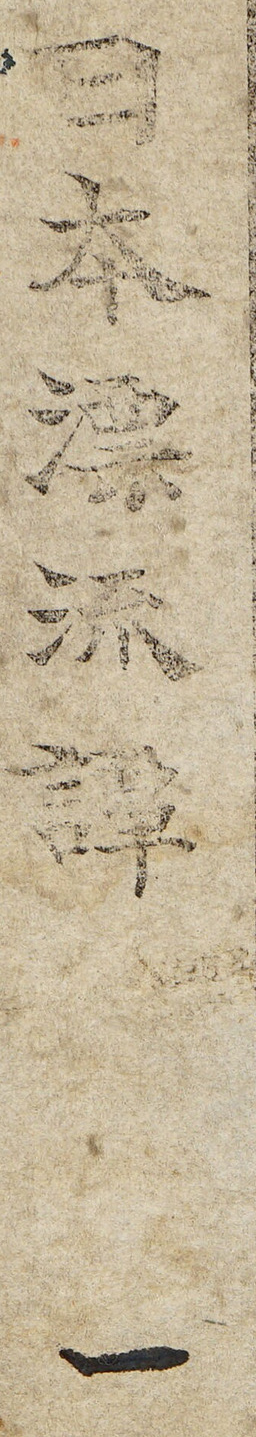日本漂流譚一

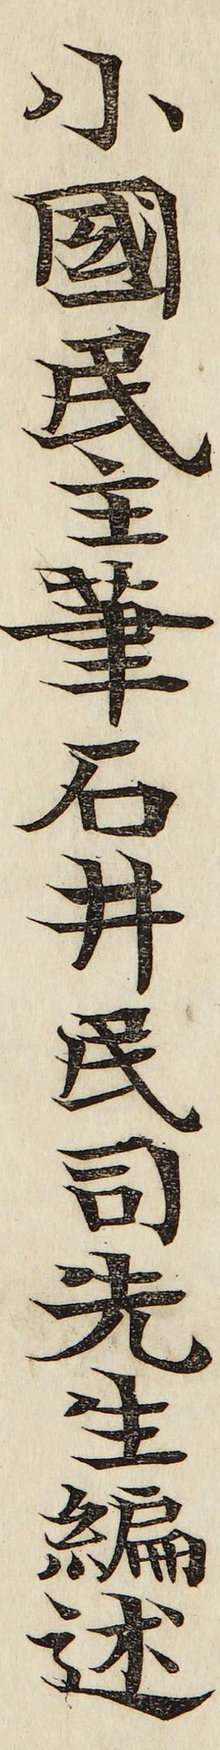小国民主茟石井民司先生編述
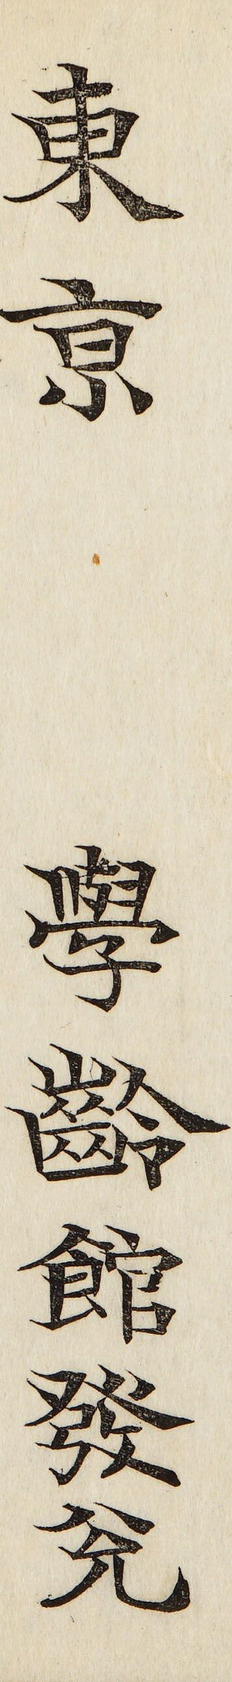東京学齢館発兌

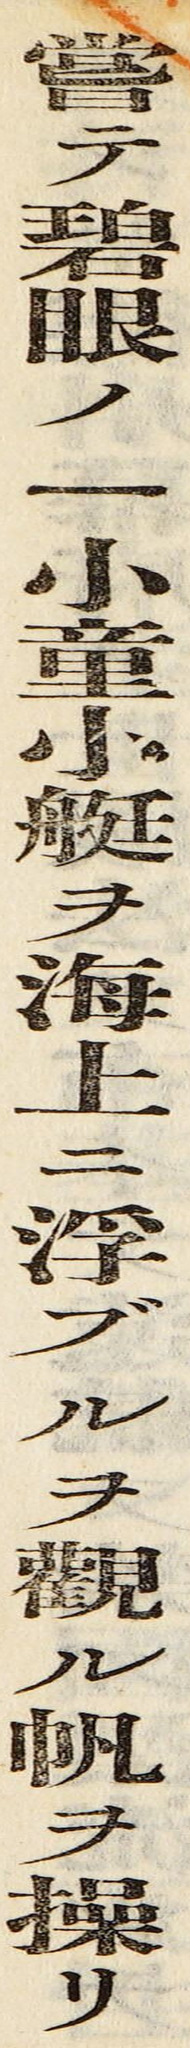嘗テ碧眼ノ一小童小艇ヲ海上ニ浮ブルヲ観ル帆ヲ操リ
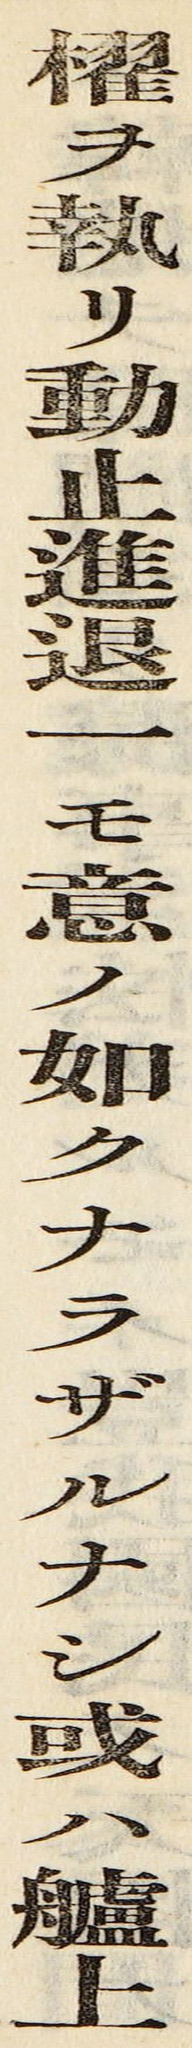櫂ヲ執リ動止進退一モ意ノ如クナラザルナシ或ハ艫上
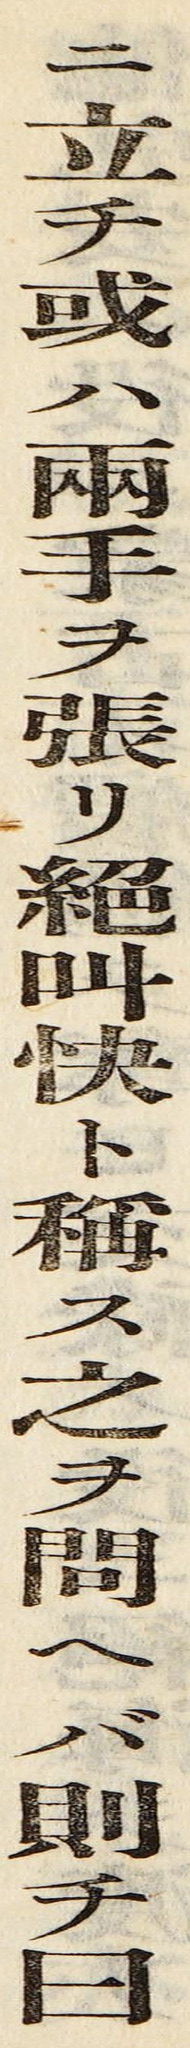ニ立チ或ハ両手ヲ張リ絶叫快ト称ス之ヲ問へバ則チ曰
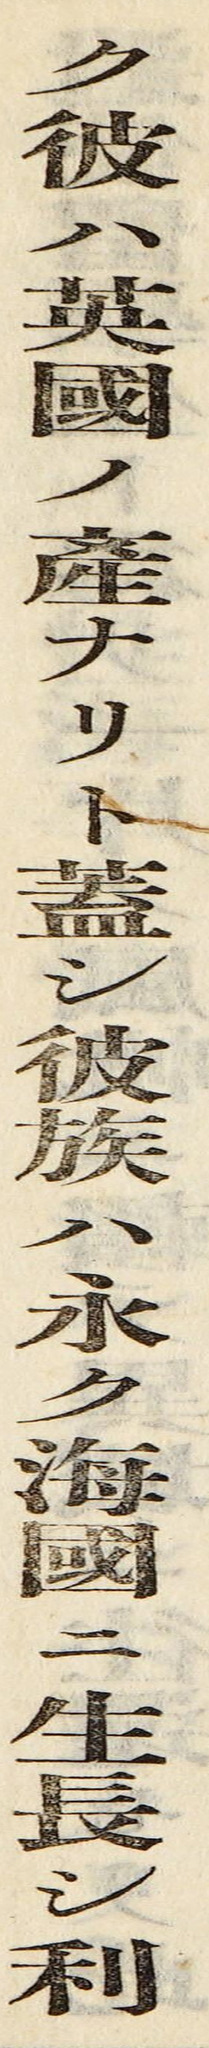ク彼ハ英国ノ産ナリト蓋シ彼族ハ永ク海国ニ生長シ利
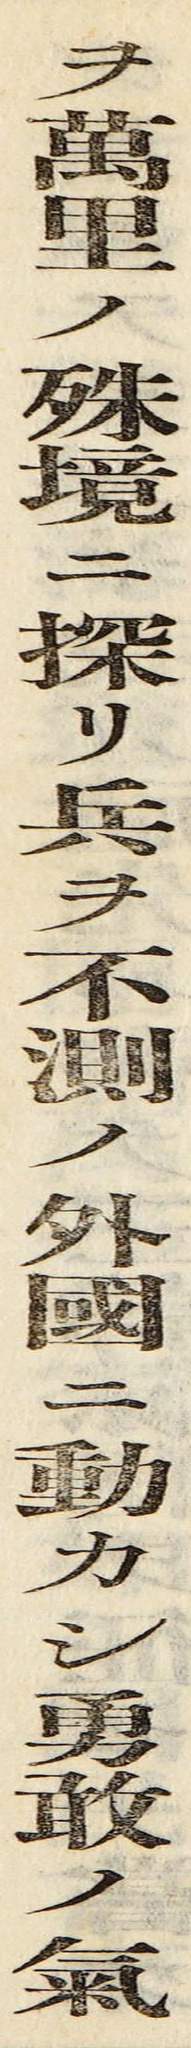ヲ万里ノ殊境ニ探リ兵ヲ不測ノ外国ニ動カシ勇敢ノ気
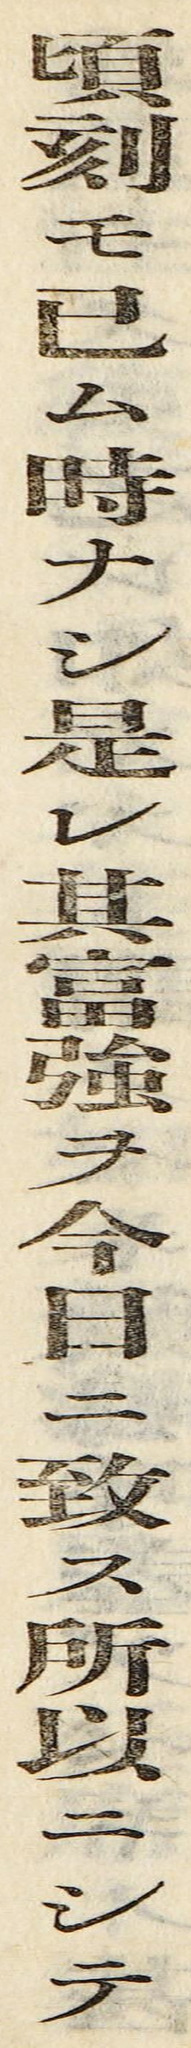頃刻モ已ム時ナシ是レ其富強ヲ今日ニ致ス所以ニシテ
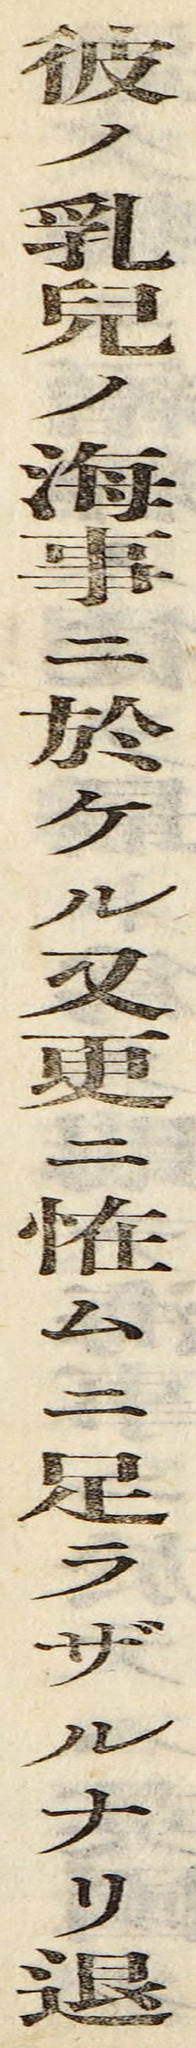彼ノ乳児ノ海事ニ於ケル又更ニ怪ムニ足ラザルナリ退
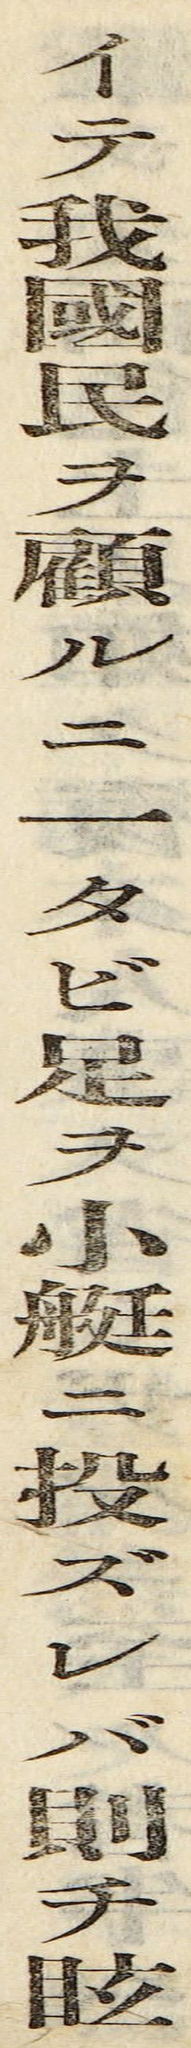イテ我国民ヲ顧ルニ一タビ足ヲ小艇ニ投ズレバ則チ眩

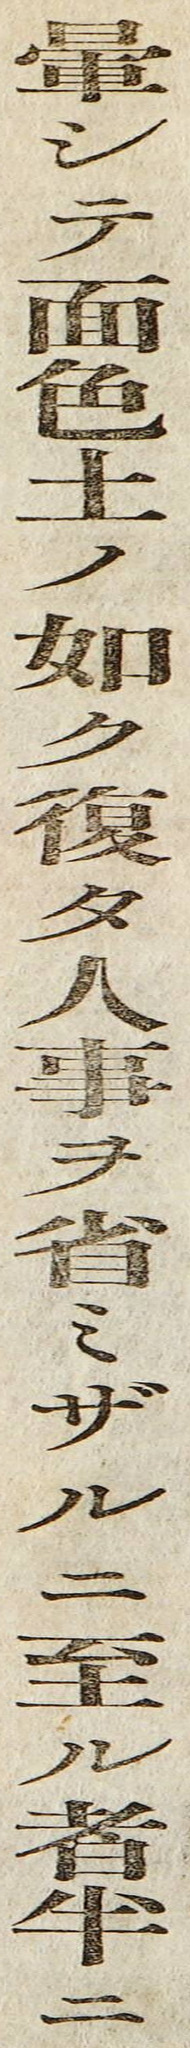暈シテ面色土ノ如ク復タ人事ヲ省ミザルニ至ル者半ニ
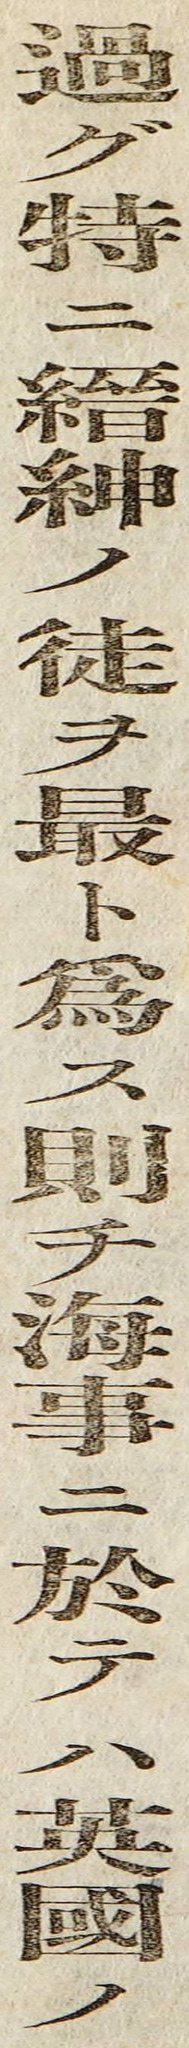過グ特ニ縉紳ノ徒ヲ最ト為ス則チ海事ニ於テハ英国ノ
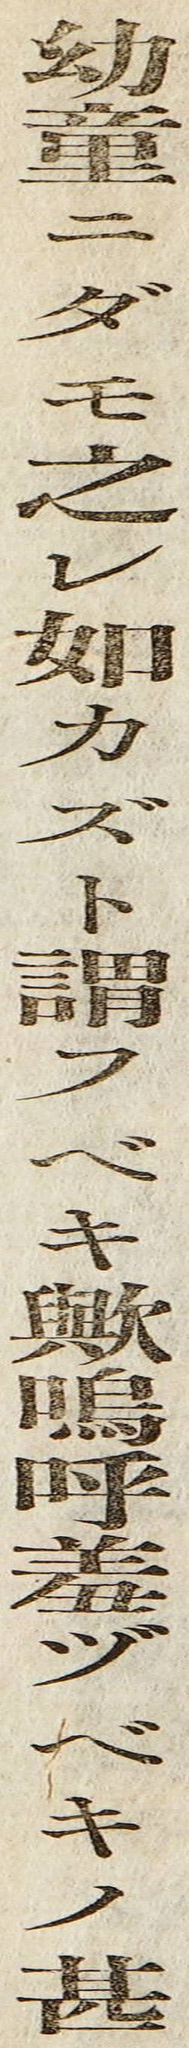幼童ニダモ之レ如カズト謂ウベキ歟嗚呼羞ヅベキノ甚
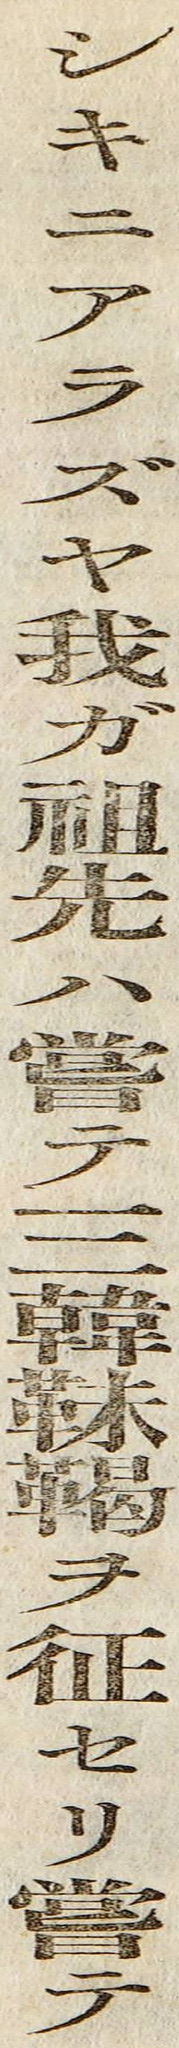シキニアラズヤ我ガ祖先ハ嘗テ三韓靺鞨ヲ征セリ嘗テ
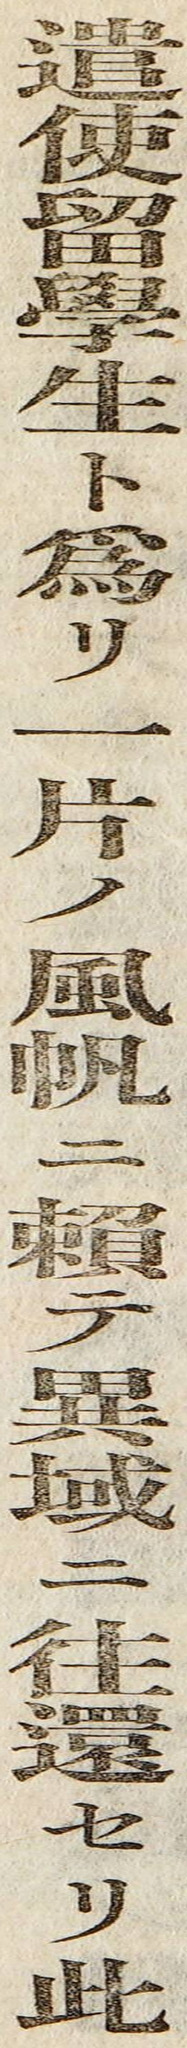遣使留学生ト為リ一片ノ風帆ニ頼テ異域ニ往還セリ此
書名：日本漂流譚
